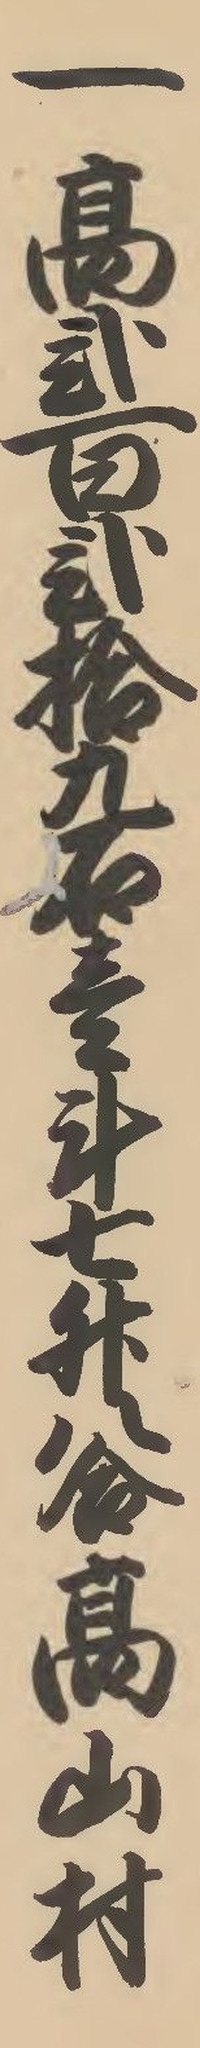一髙弐百弐拾九石壱斗七升八合髙山村
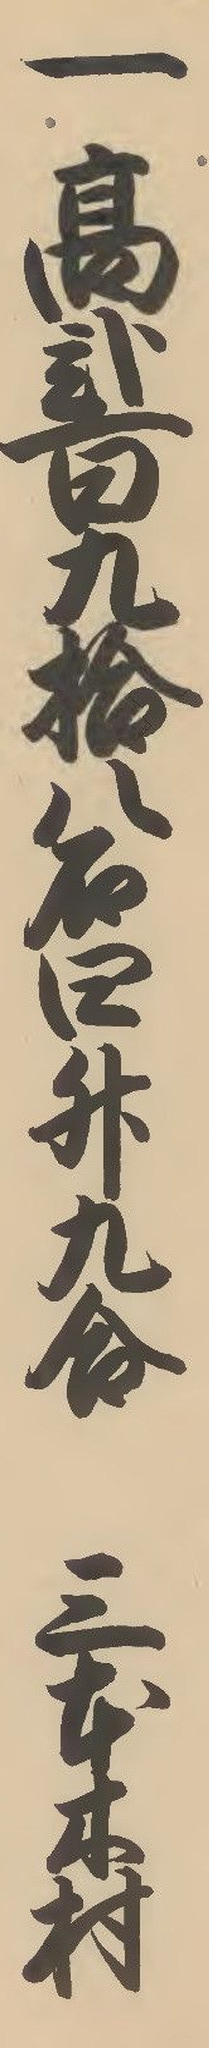一髙弐百九拾八石四升九合三本木村
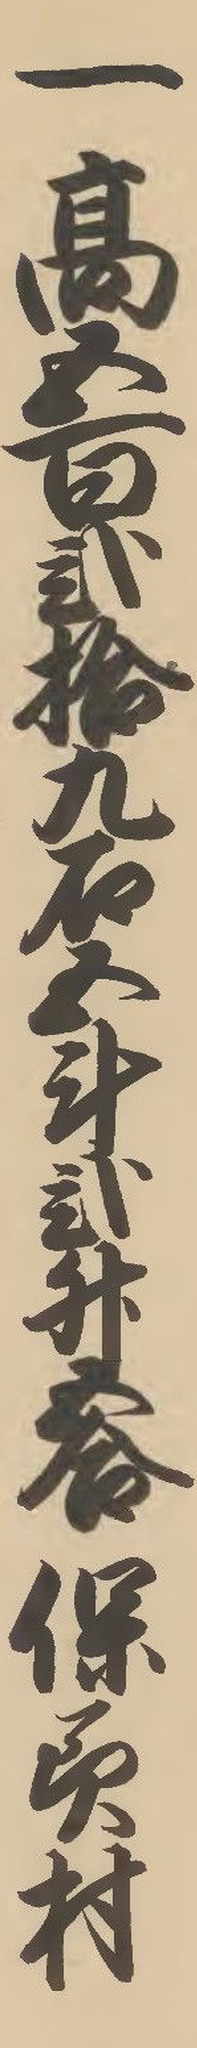一髙五百弐拾九石五斗弐升五合保美村
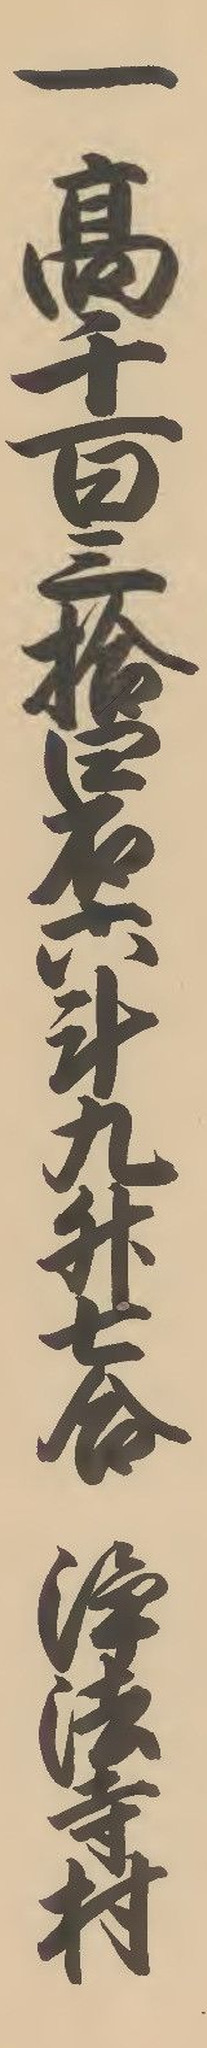一髙千百三拾四石六斗九升七合浄法寺村

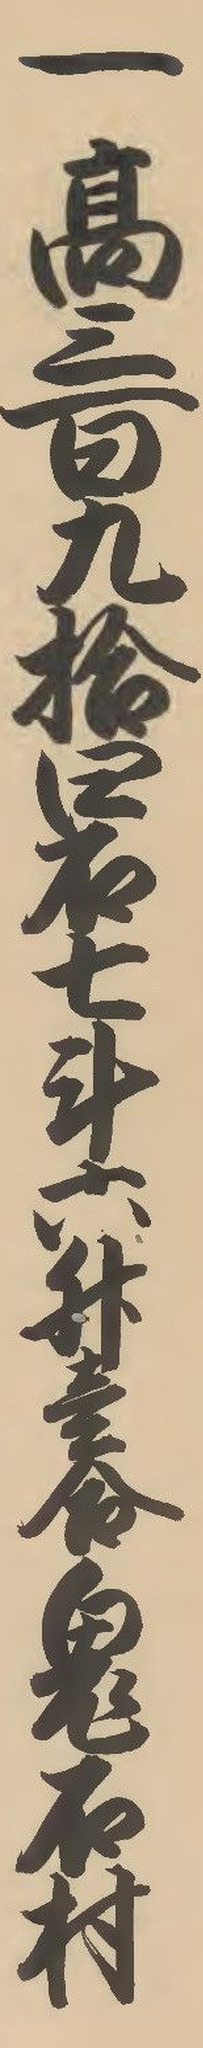一髙三百九拾四石七斗六升壱合鬼石村
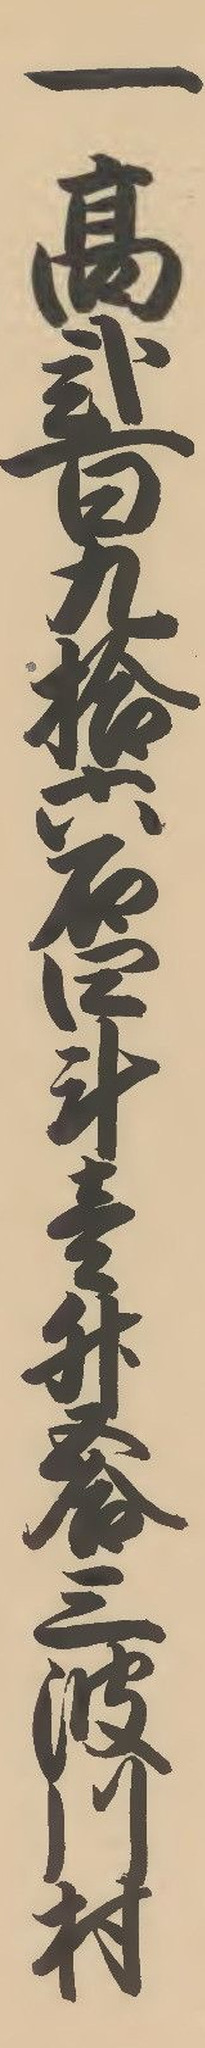一髙弐百九拾六石四斗壱升五合三波川村
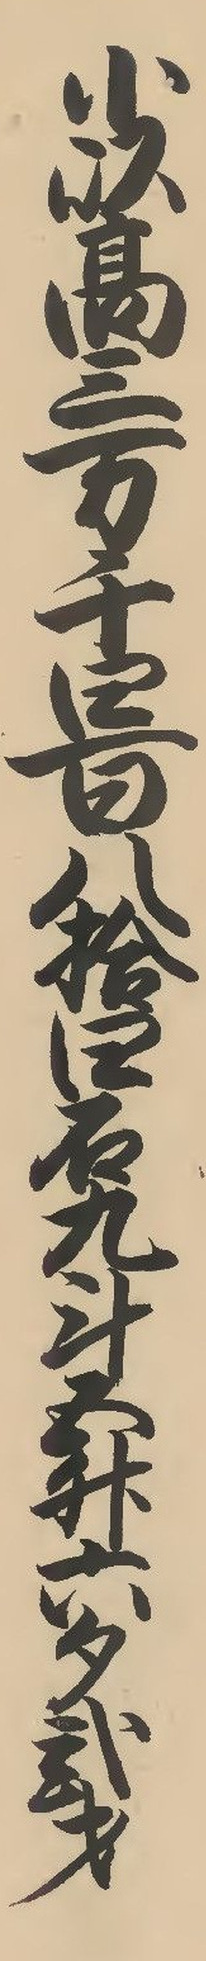小以髙三万千四百八拾四石九斗五升六夕弐才
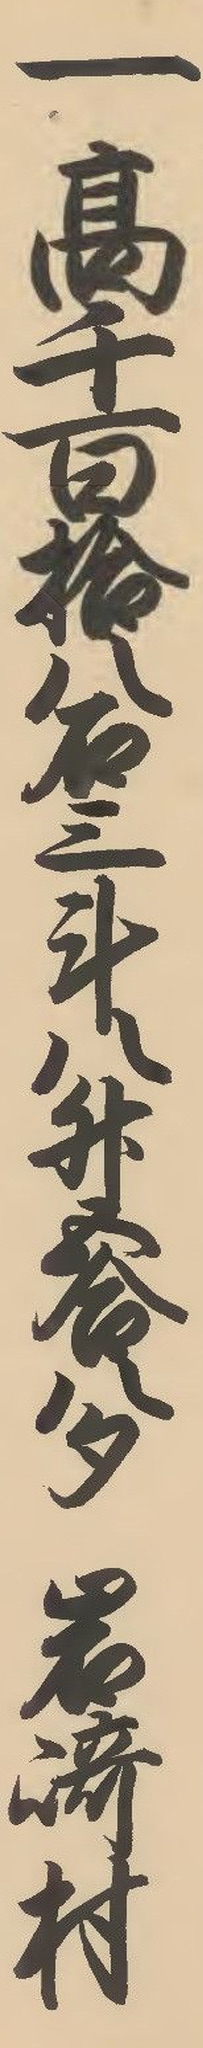一髙千百拾八石三斗八升五合八夕岩崎村
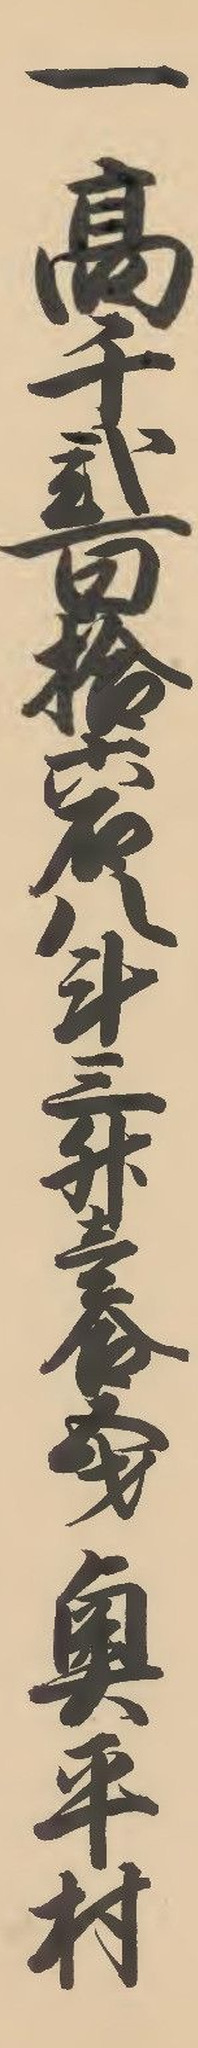一髙千弐百拾六石八斗三升壱合五才奥平村
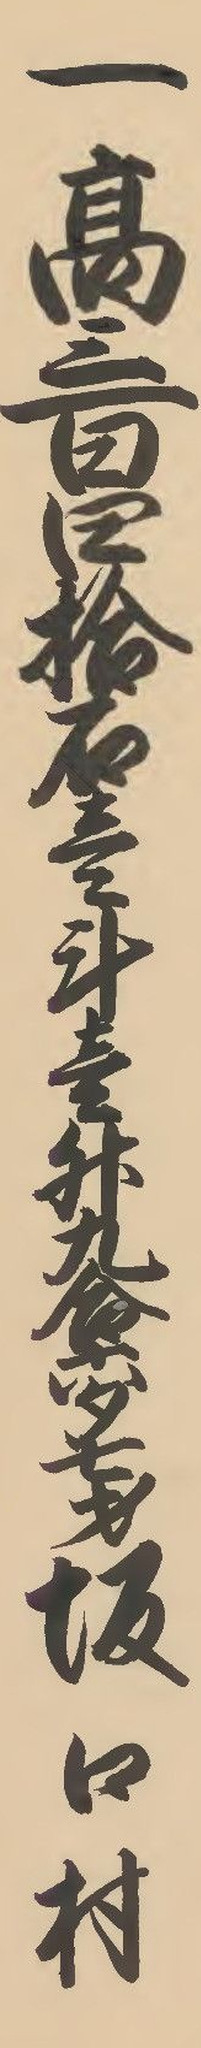一髙三百四拾石壱斗壱升九合六夕七才坂口村

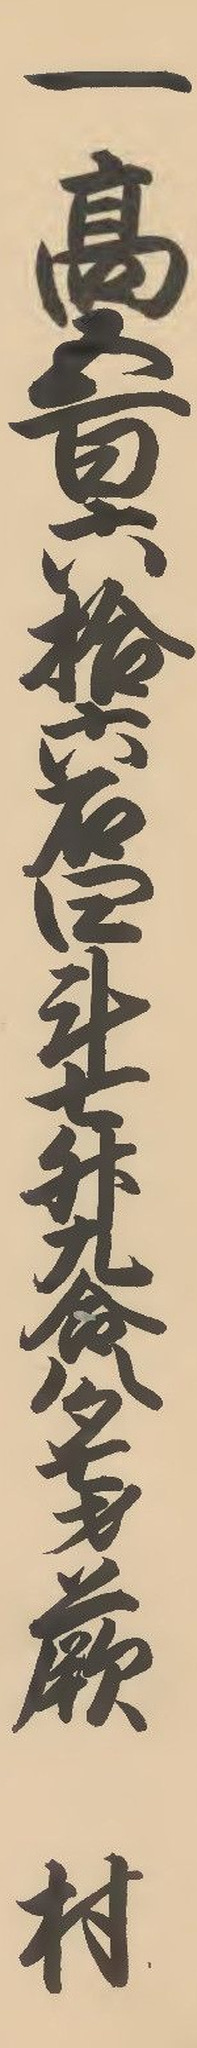一髙五百六拾六石四斗七升九合八夕七才
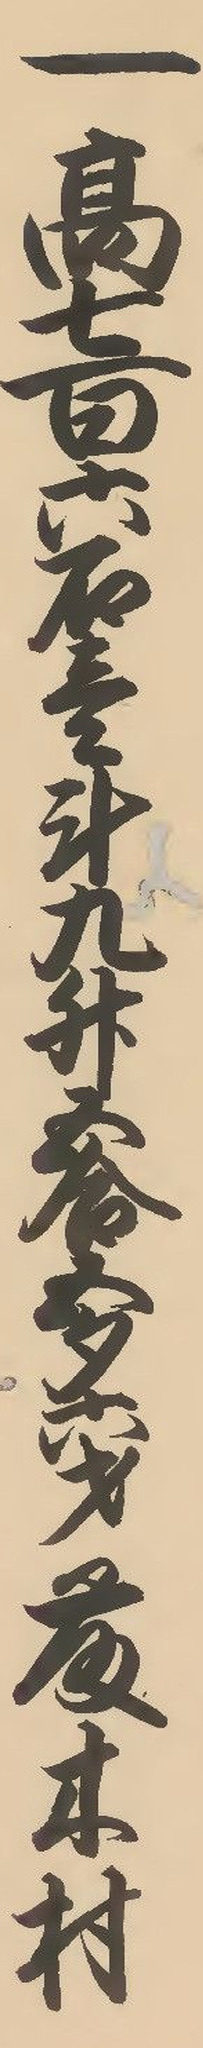一髙七百六石壱斗九升五合五夕六才
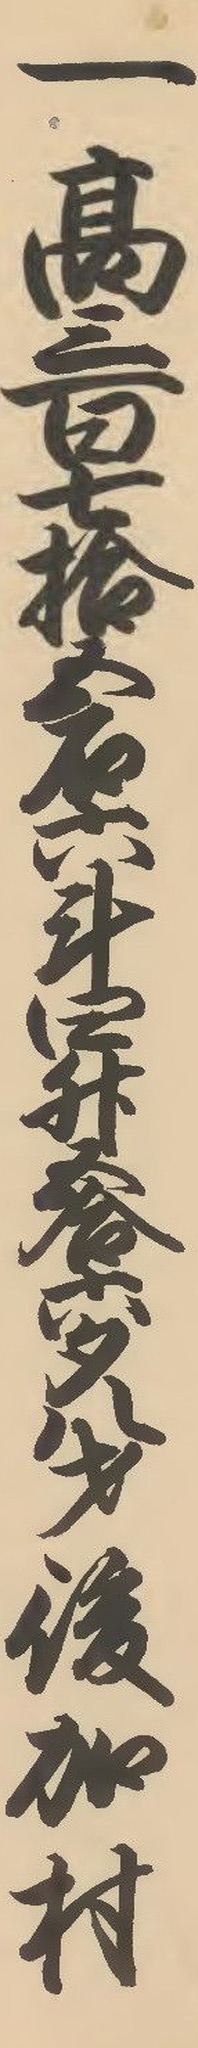一髙三百七拾五石六斗四升五合六夕八才
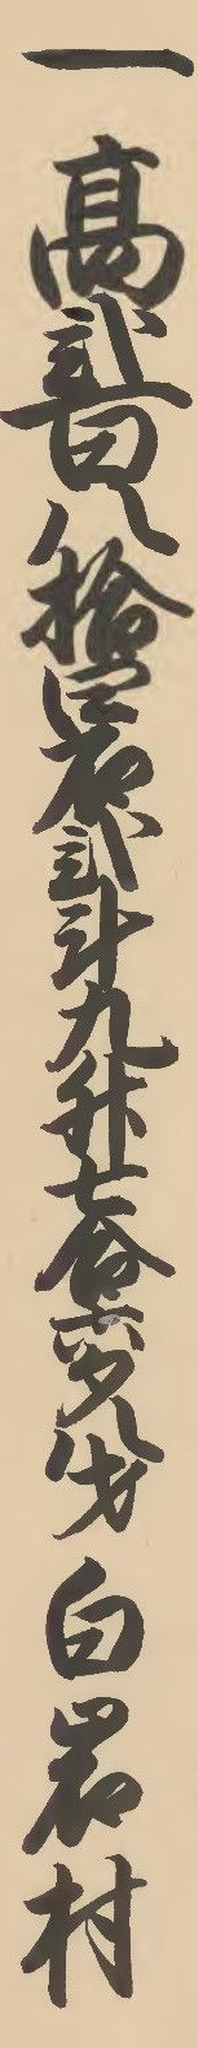一髙弐百八拾四石弐斗九升七合六夕八才

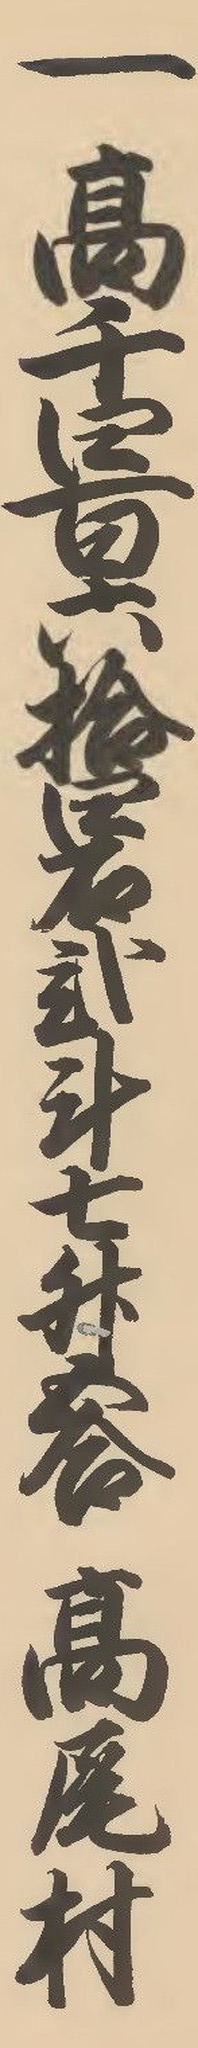一髙千四百六拾四石弐斗七升五合髙尾村
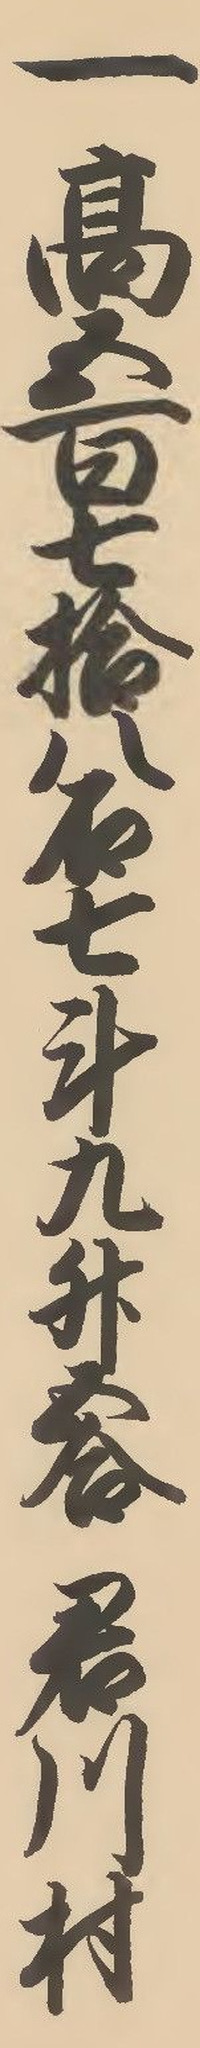一髙五百七拾八石七斗九升五合君川村
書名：上野国郷帳
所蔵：国立公文書館 National Archives of Japan
